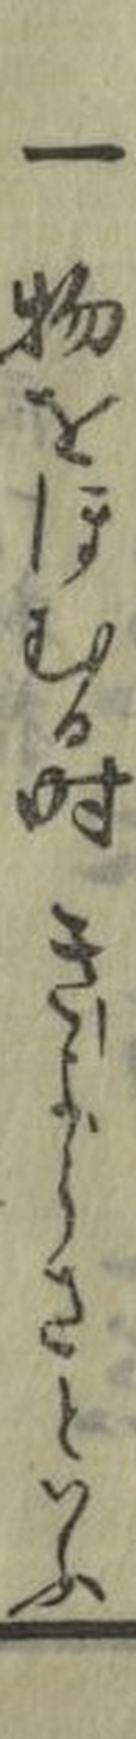一物をほむる時きよらさといふ
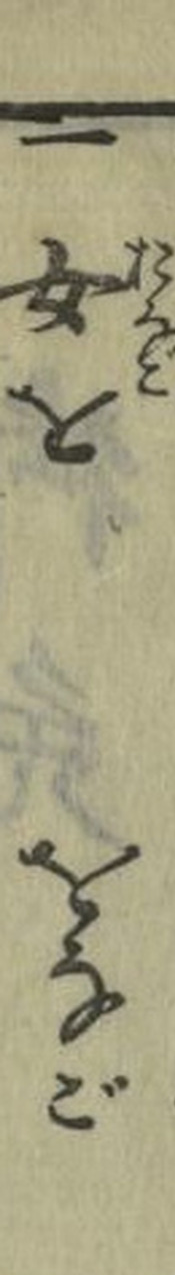一女ををなご
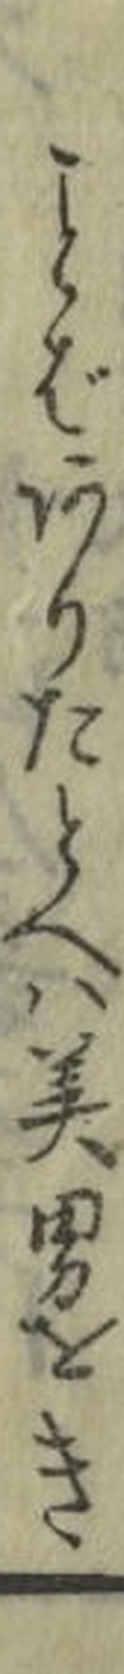ことばありたとへは美男をき
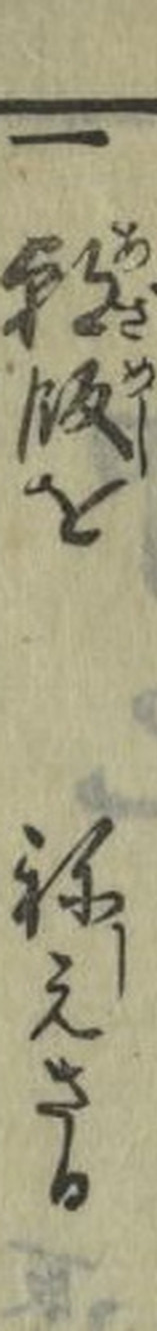一朝飯をねえさる
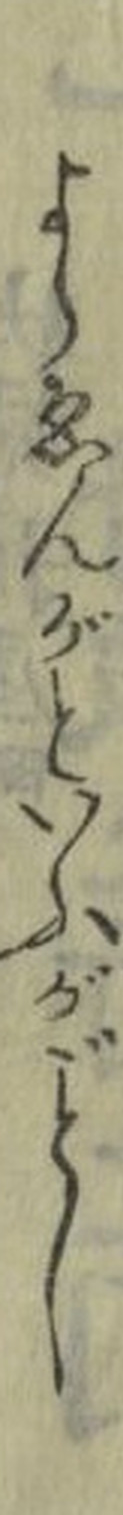よらゑんがといふがごとし
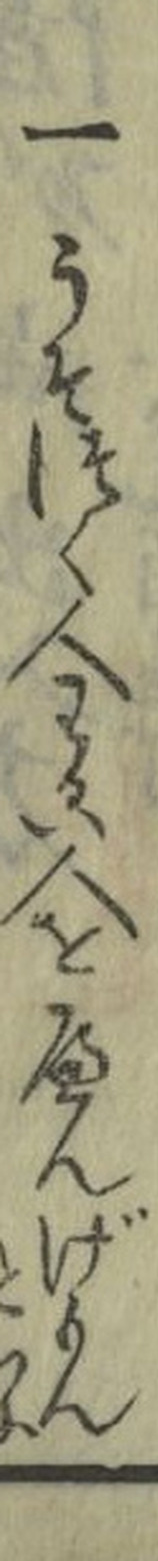一うそつく人わるい人をへんげもんといふ
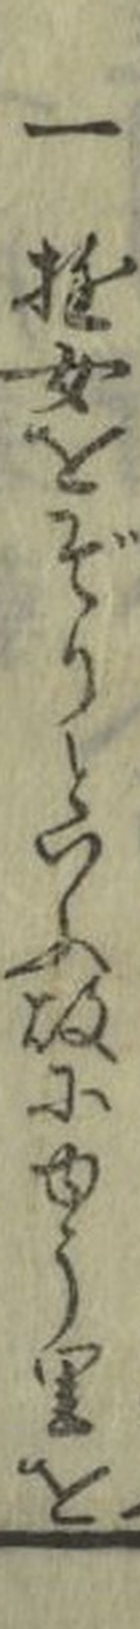一遊女をぞりといふ故にゆう里を
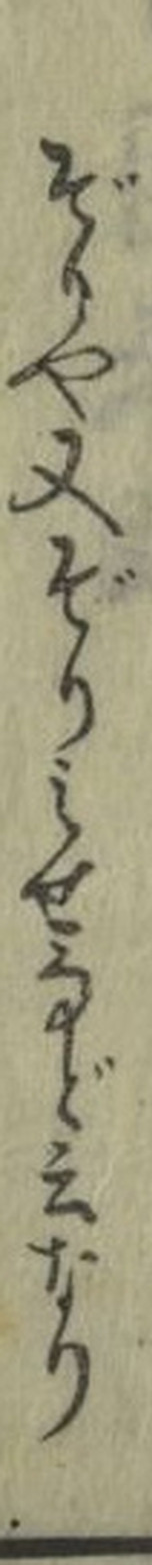ぞりや又ぞりみせなど云なり

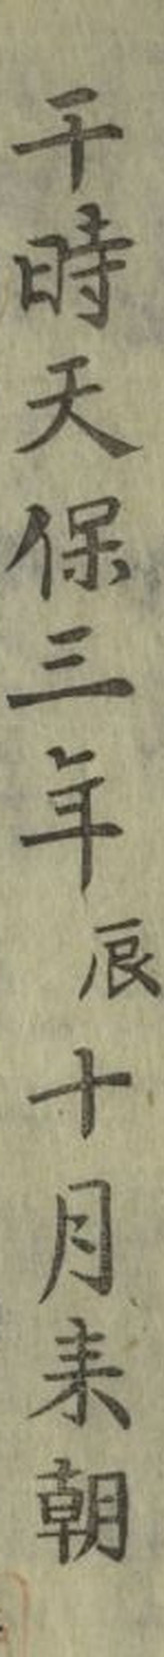干時天保三年辰十月来朝
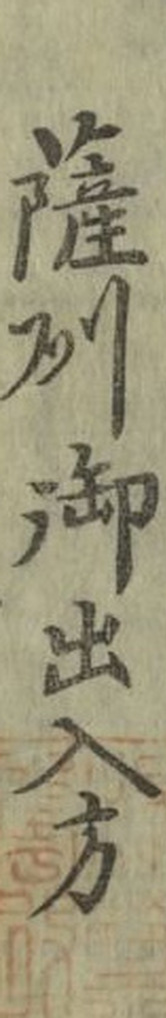薩州御出入方
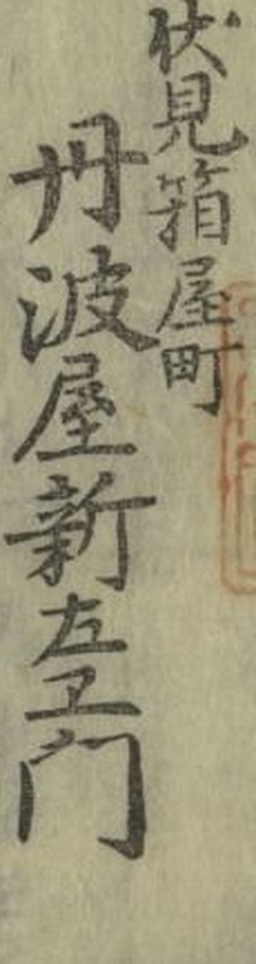丹波屋新左ヱ門
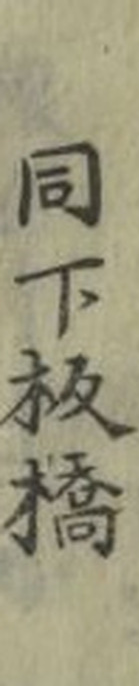同下板橋
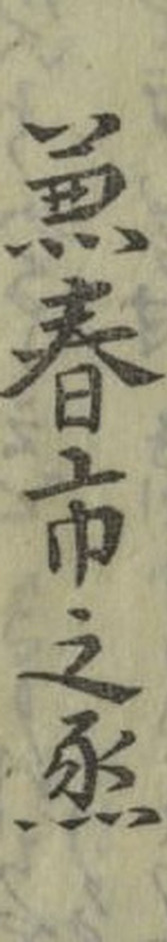兼春市之丞
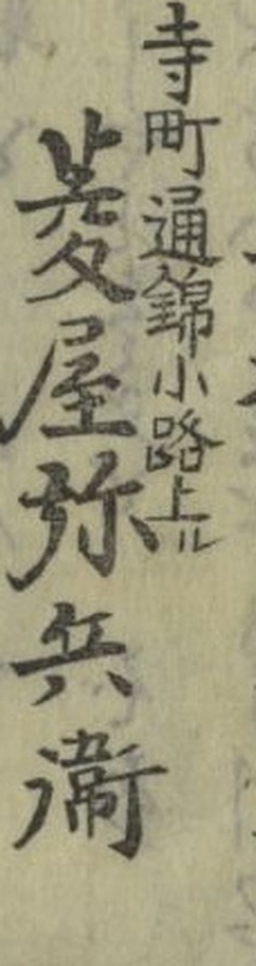菱屋弥兵衛

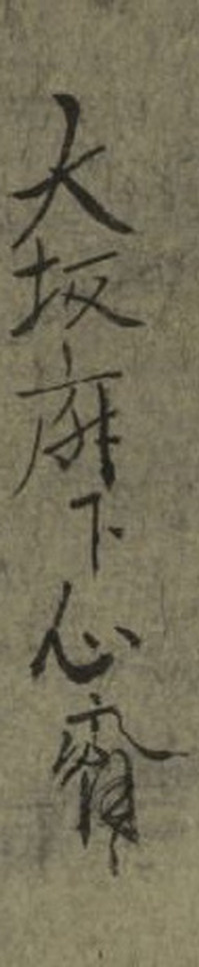大坂府下心齊
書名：新板 琉球人行列記
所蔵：University of the Ryukyus Library
